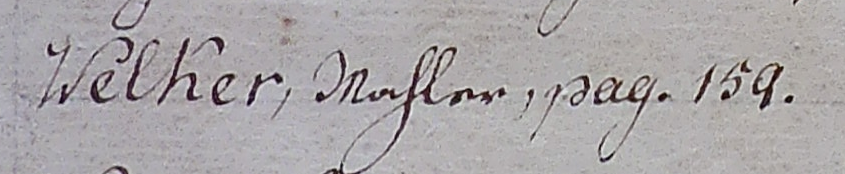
Welker, Mahler, pag. 159.
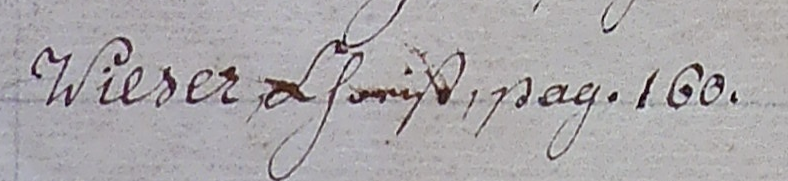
Wieser, Chorist, pag. 160.
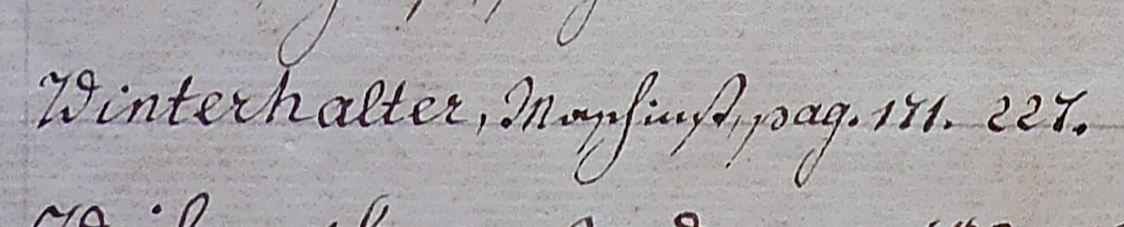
Winterhalter, Maschinist, pag. 171. 227.
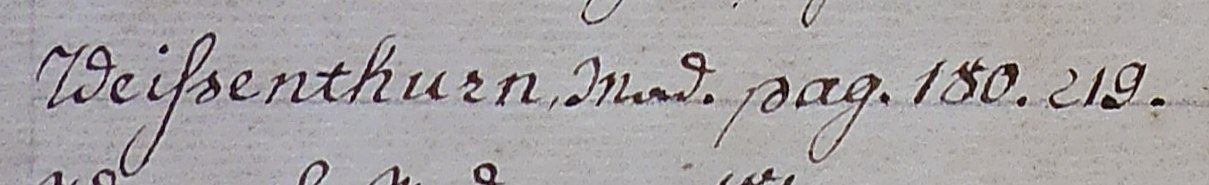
Weissenthurn, Mad. pag. 180. 219.
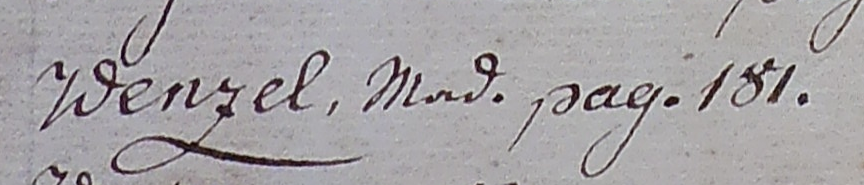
Wenzel, Mad. pag. 181.
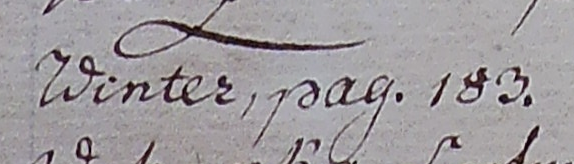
Winter, pag. 183.
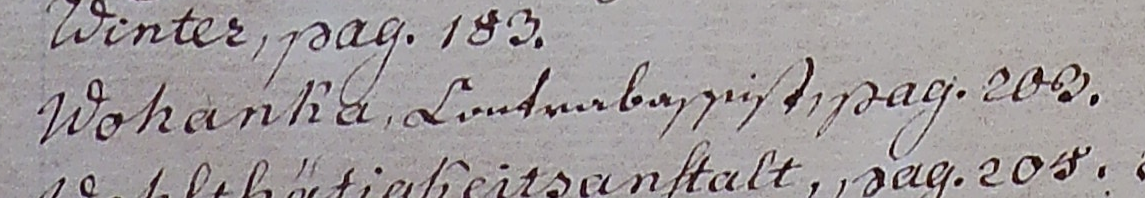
Wohanka, Contrabassist, pag. 2o3.
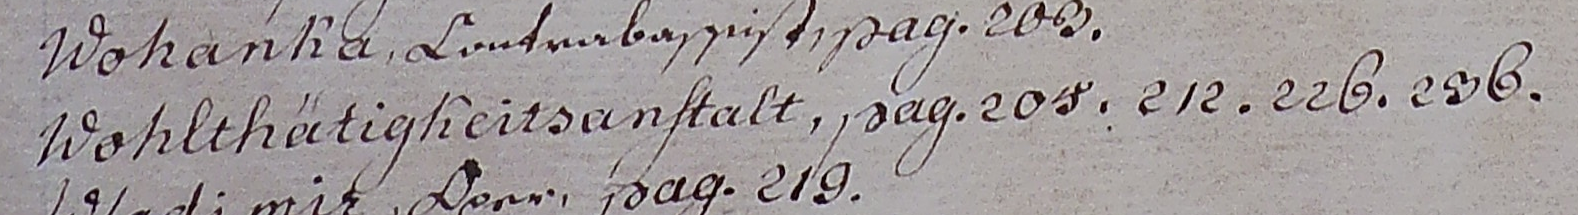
Wohlthätigkeitsanstalt, pag. 205. 212. 226. 236.
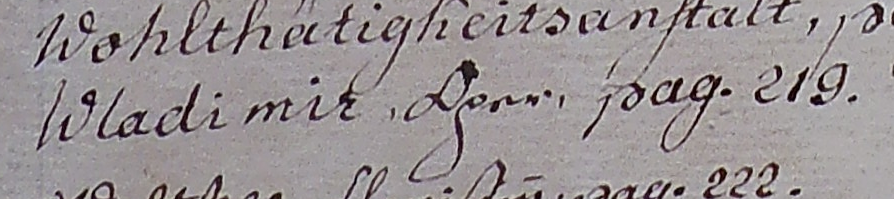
Wladimir, Oper, pag. 219.
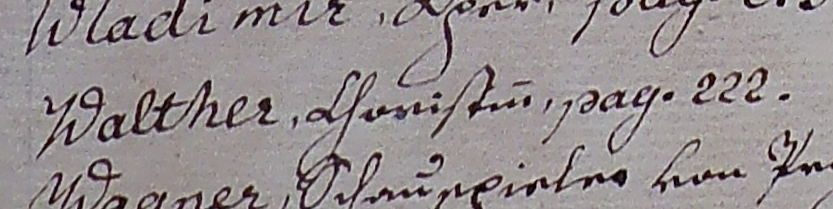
Walther, Choristin̅, pag. 222.
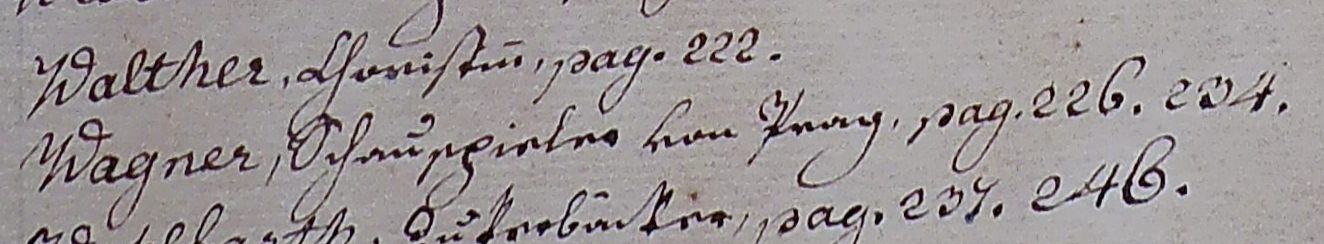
Wagner, Schauspieler von Prag, pag. 226. 234.
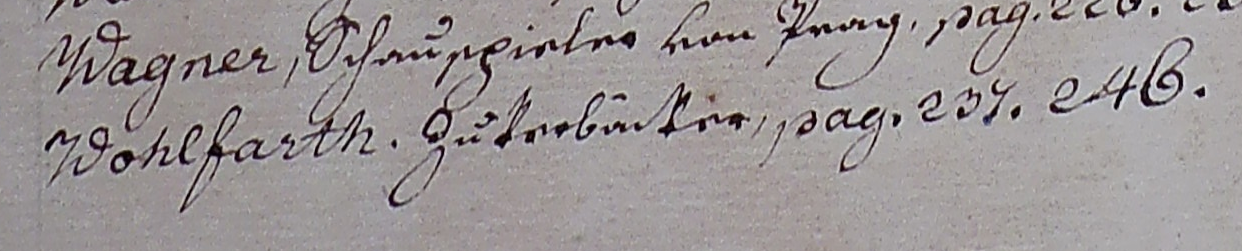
Wohlfarth. Zuckerbäcker, pag. 237. 246.
